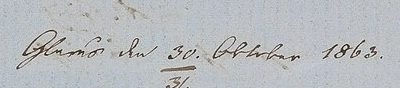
Glarus den 30./31. Oktober 1863.
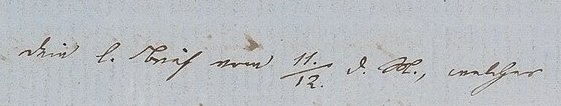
Dein l. Brief vom 11./12. d. M. , welcher
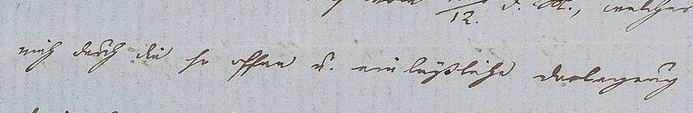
mich durch die so offne u. einläßliche Darlegung
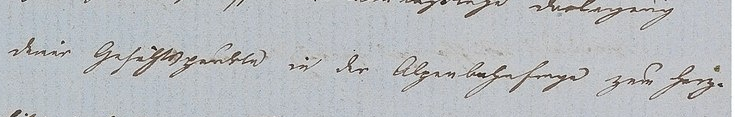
Deiner Gesichtspunkte in der Alpenbahnfrage zum herz-
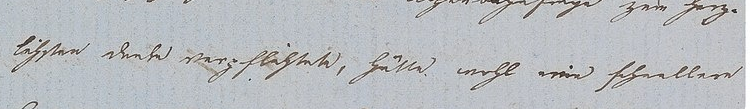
lichsten Danke verpflichtete, hätte wohl eine schnellere
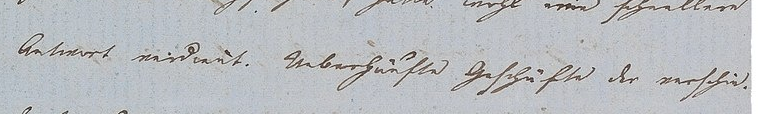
Antwort verdient. Ueberhäufte Geschäfte der verschie-
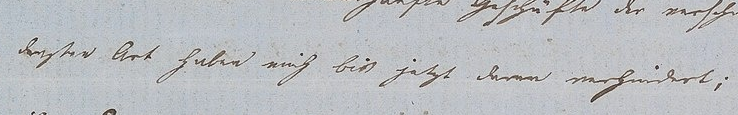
densten Art haben mich bis jetzt daran verhindert;
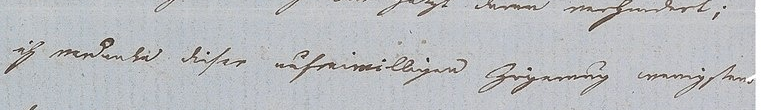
ich verdanke dieser unfreiwilligen Zögerung wenigstens
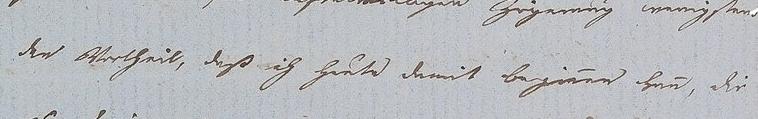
den Vortheil, daß ich heute damit beginnen kann, Dir
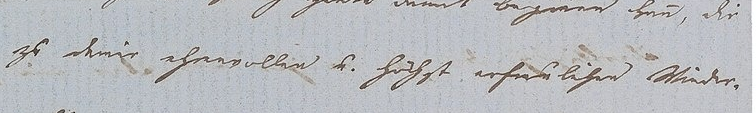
zu Deiner ehrenvollen u. höchst erfreulichen Wieder-
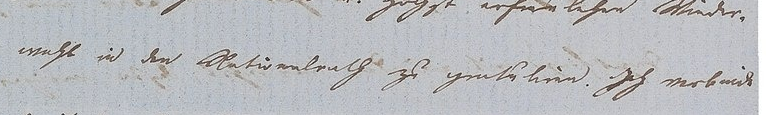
wahl in den Nationalrath zu gratuliren. Ich verbinde
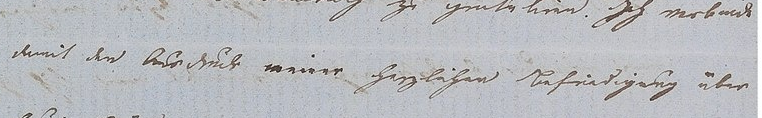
damit den Ausdruck meiner herzlichen Befriedigung über
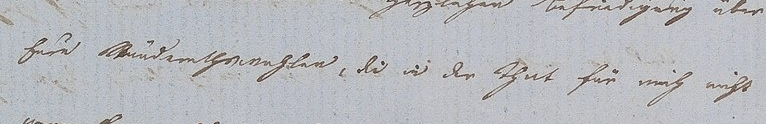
Eure Ständerathswahlen, die in der That für mich nicht
